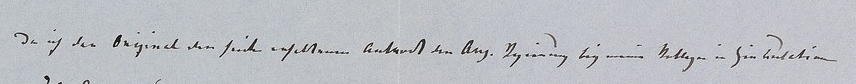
Da ich das Original der heute erhaltenen Antwort der Arg. Regierung bey meinen Kollegen in Zirkulation
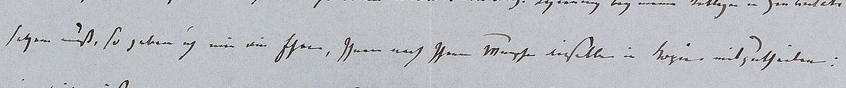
setzen muß, so geben ich mir die Ehre, Ihnen nach Ihrem Wunsche dieselbe in Kopie mitzutheilen:
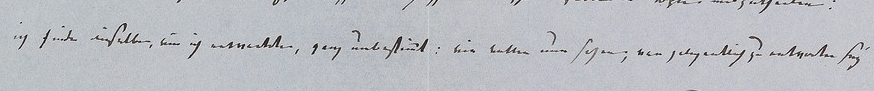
ich finde dieselbe, wie ich erwartete, ganz unbestimmt: wir wollen nun sehen, was gelegentlich zu antworten sey
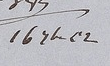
16. 7br 52.
